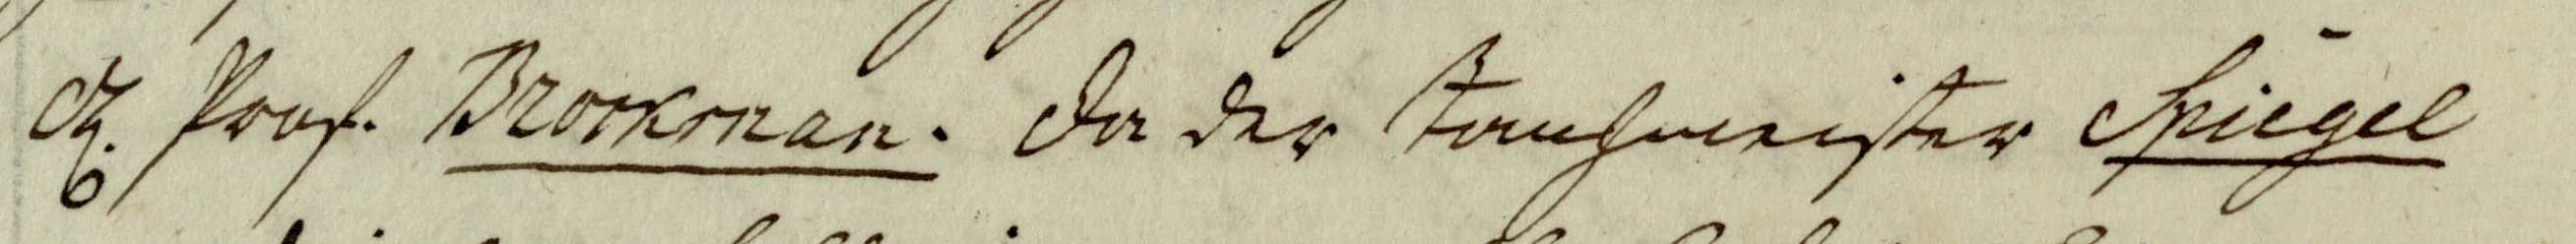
dh. Prof. Brockmann. Da der Tanzmeister Spiegel
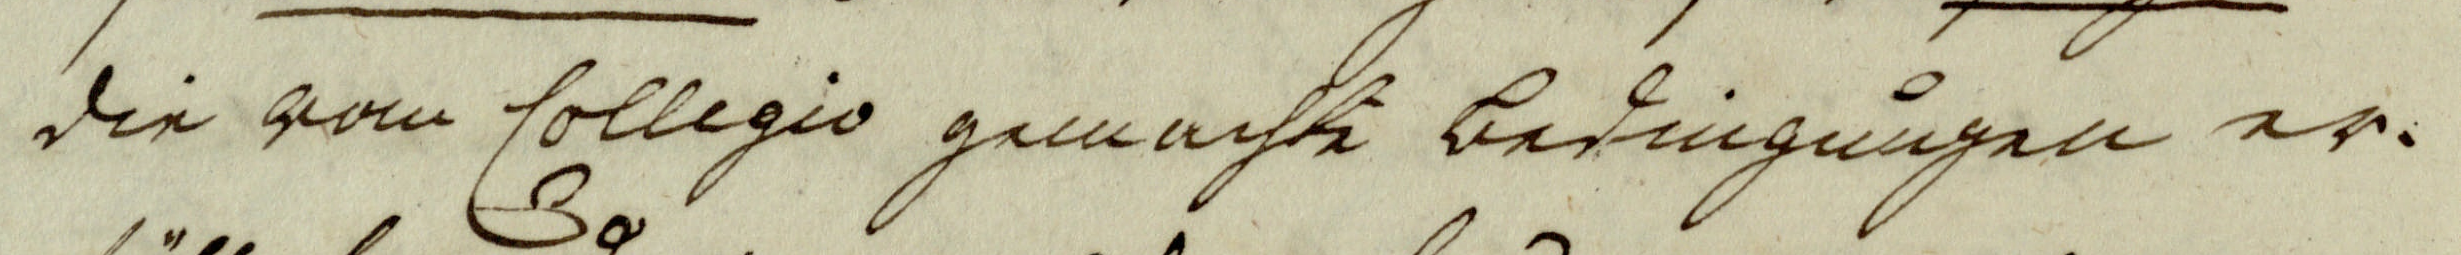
die vom Collegio gemachte Bedingungen er¬
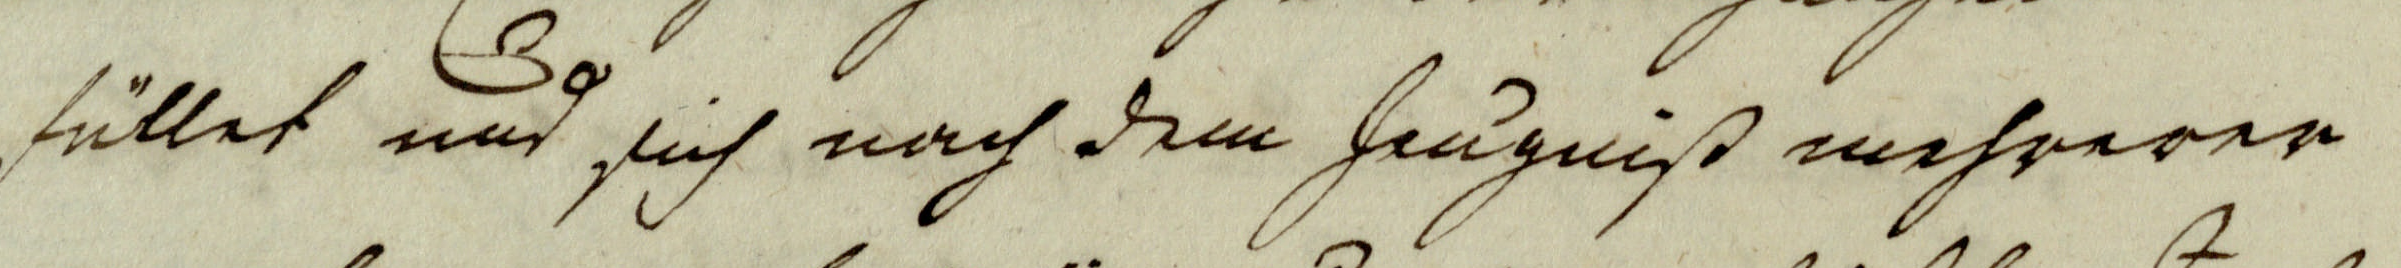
füllet und sich nach dem Zeugniß mehrerer
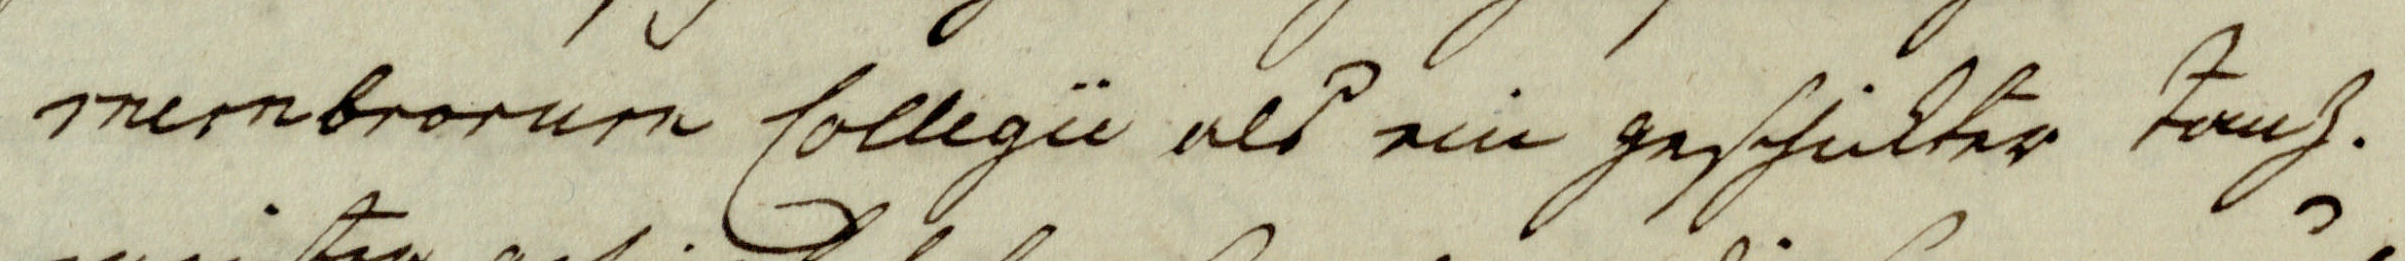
membrorum Collegii als ein geschickter Tanz¬
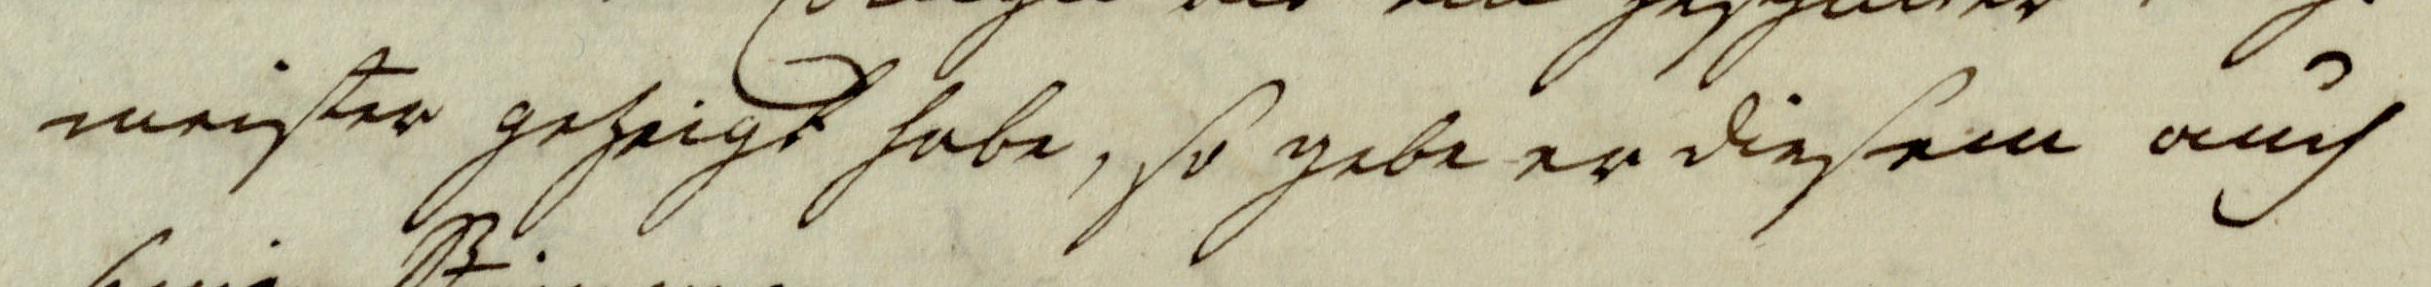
meister gezeigt habe, so gebe er diesem auch
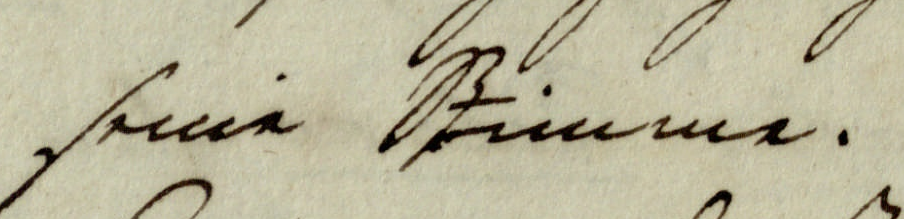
seine Stimme.
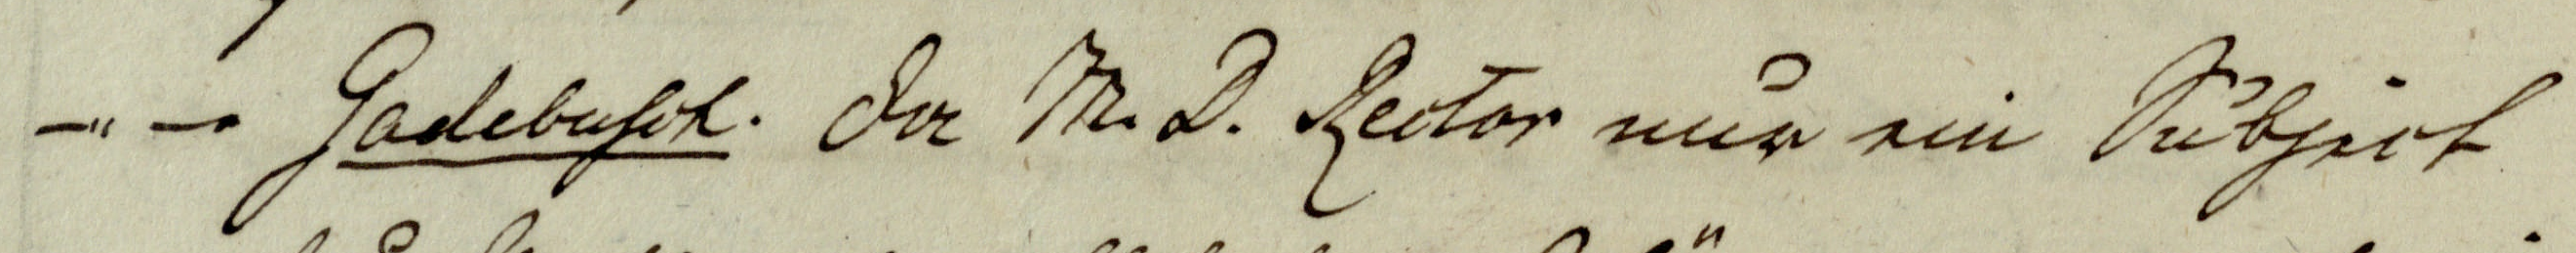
Gadebusch. Da M. D. Rector nur ein Subject
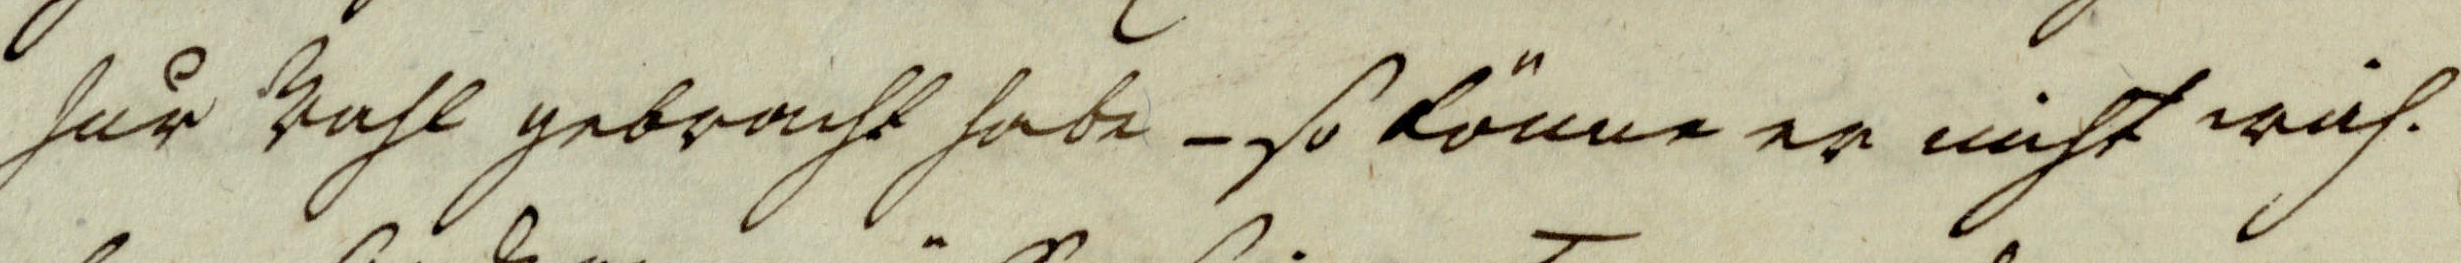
zur Wahl gebracht habe so könne er nicht wäh¬
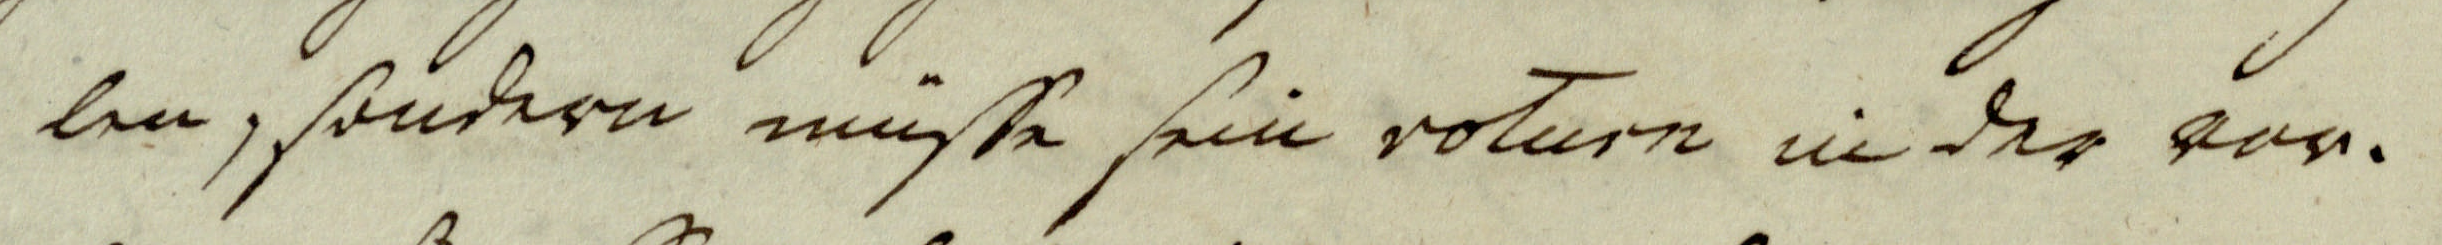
len, sondern müsse sein votum in der vor¬
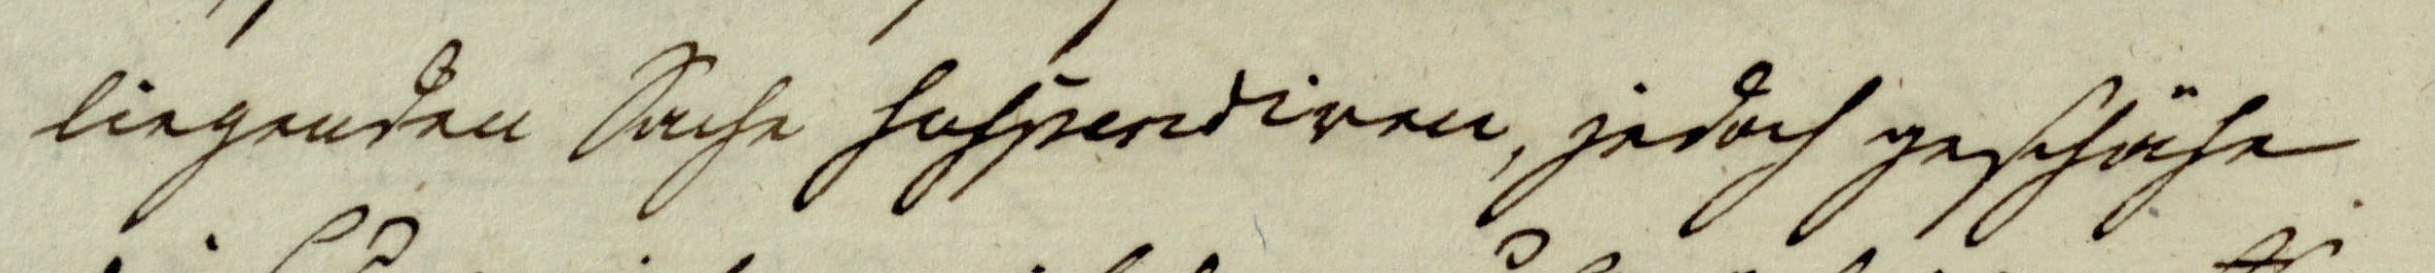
liegenden Sache suspendiren, jedoch geschähe
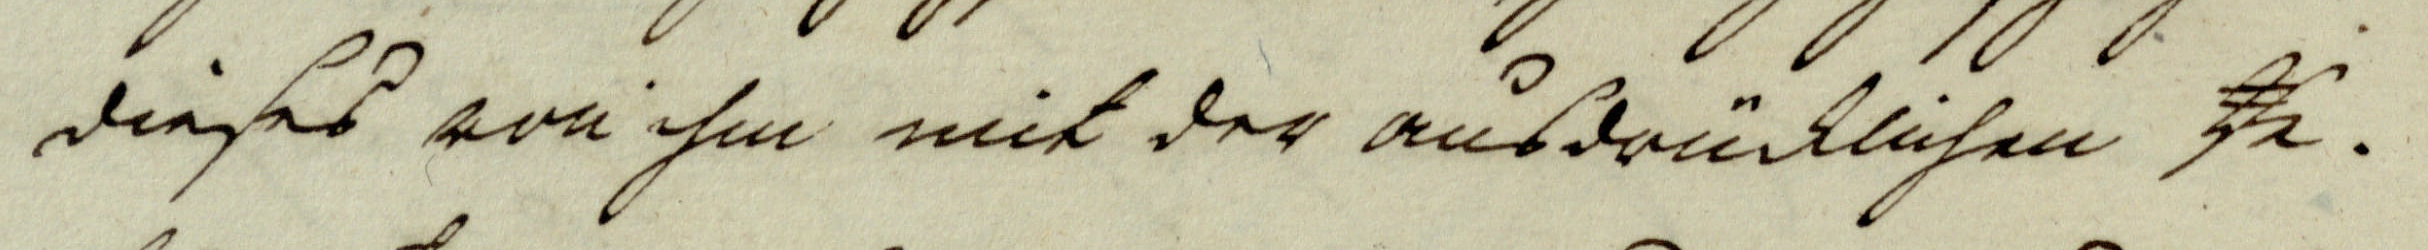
dieses von ihm mit der ausdrücklichen Re¬
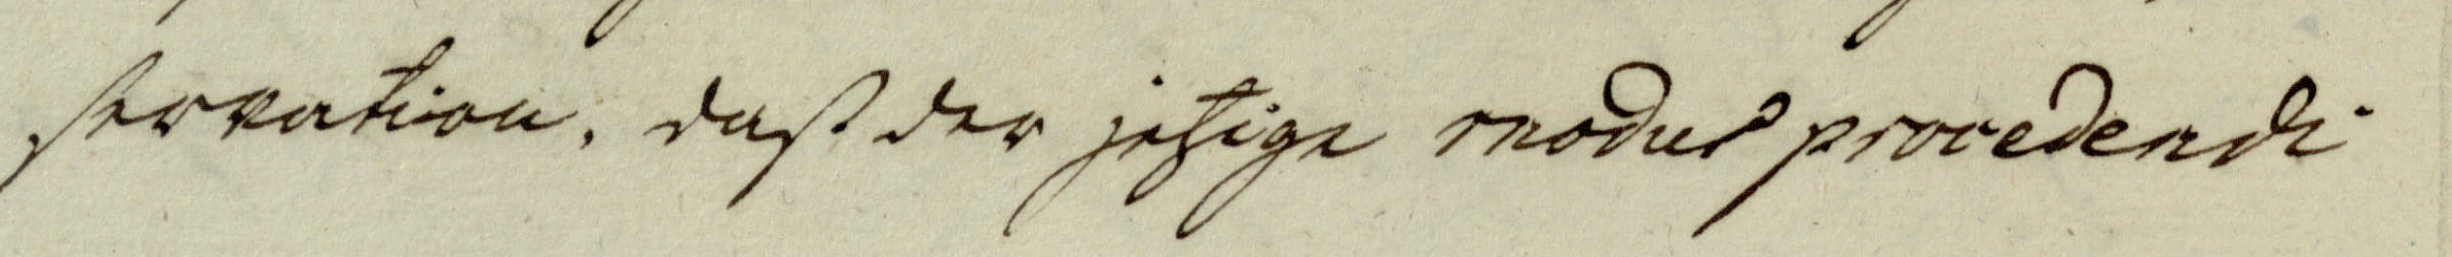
servation, daß der jetzige modus procedendi
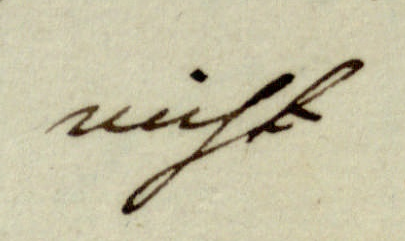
nicht
